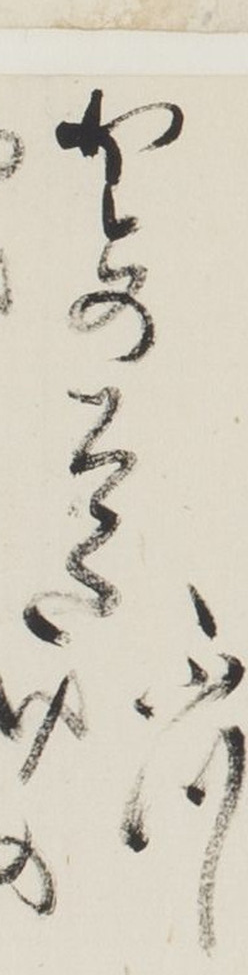かとのそたけの
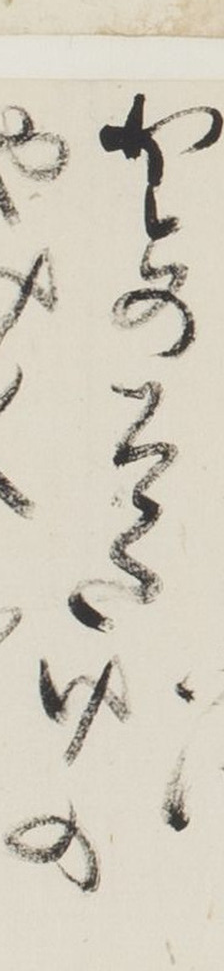かとのそたけの
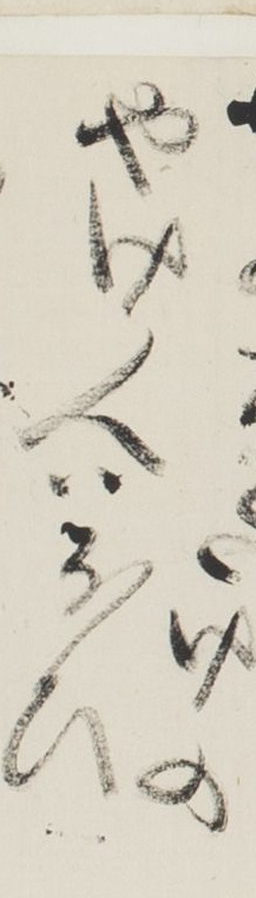やけ人はおひ
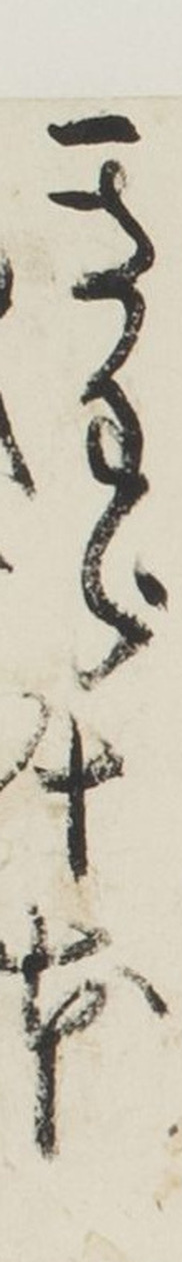一さわら十本
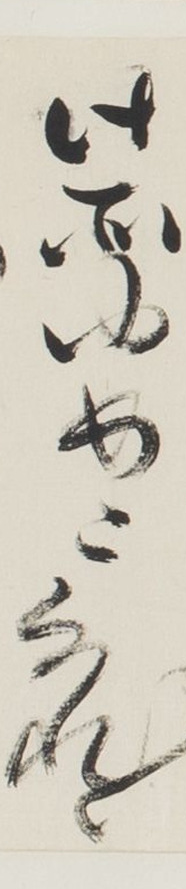此所ゆめになれ候
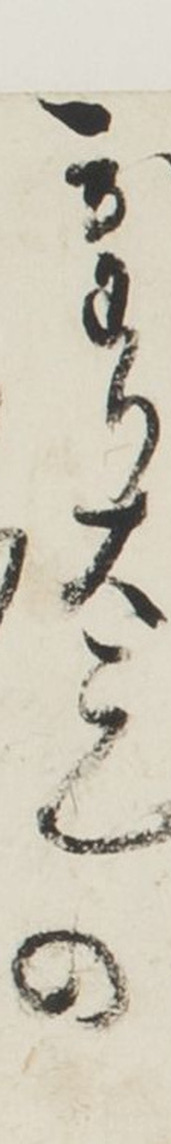一おわり大こんの
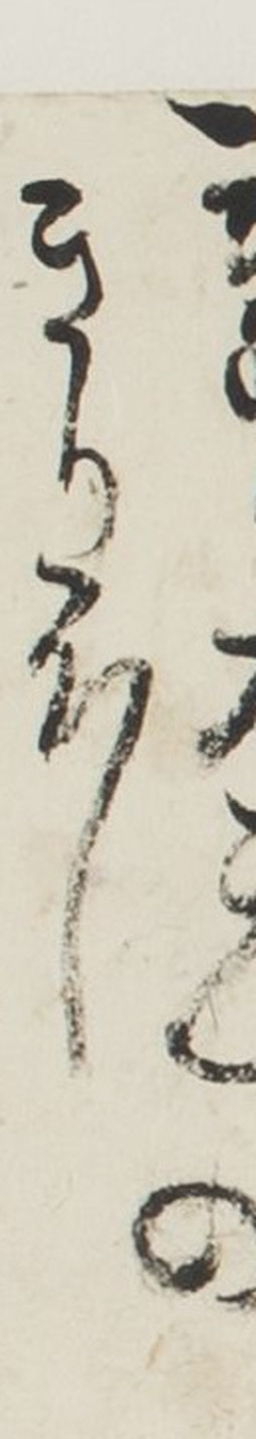きりほし
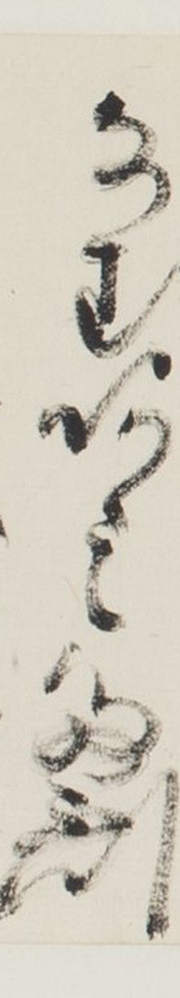なむあみたふつ
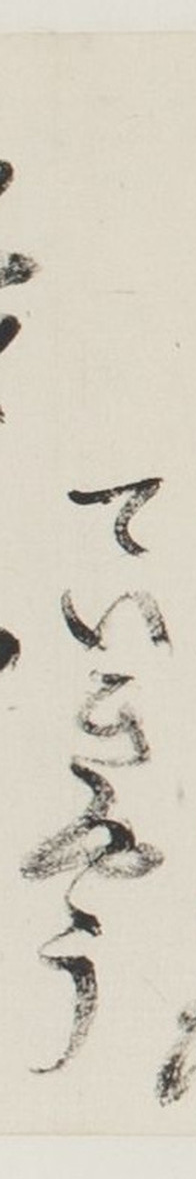ていきやう
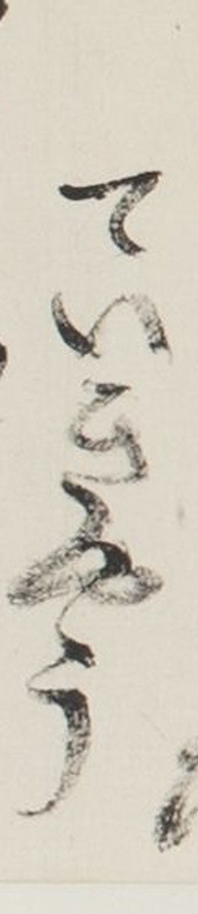ていきやう
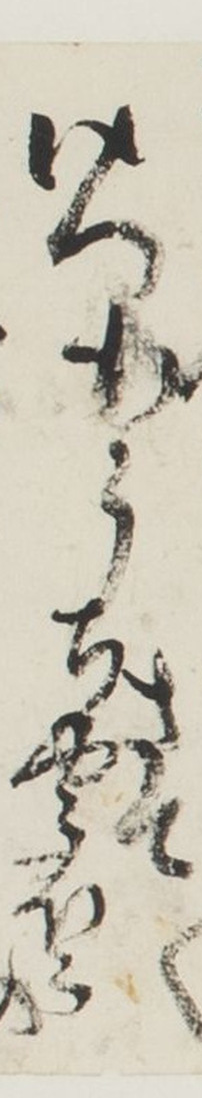けつかうちやうほうの
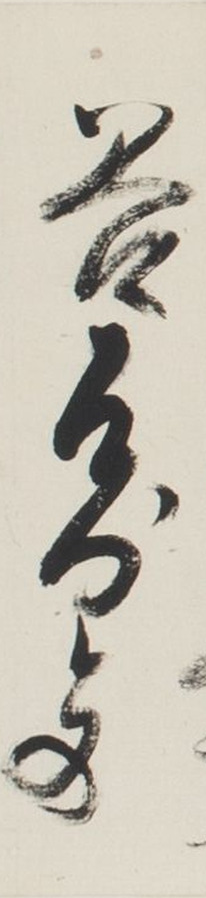善左衛門との
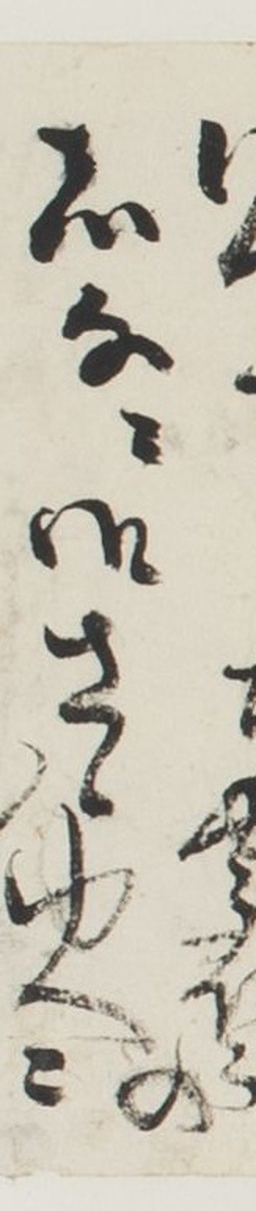しなに御さ候ゆへに
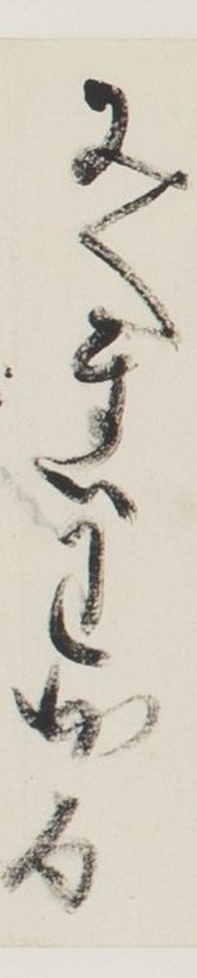みへまいわかる
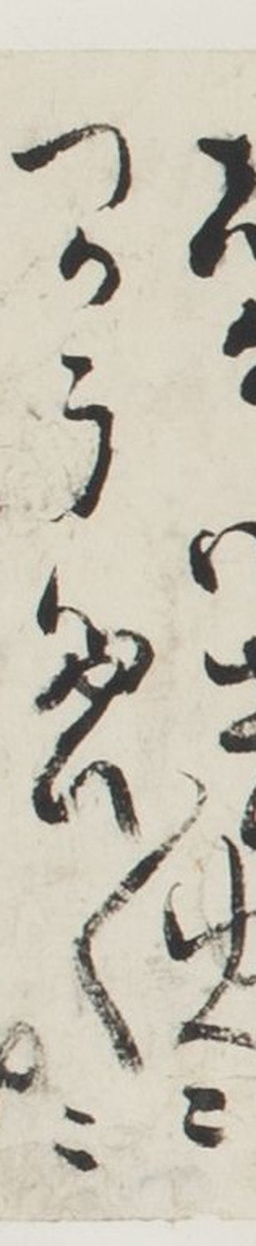つかうたひ〳〵に
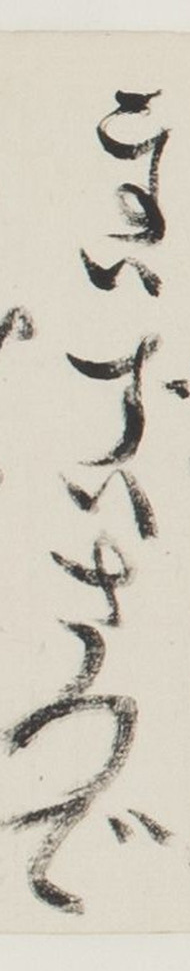まいすいさつで
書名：京洛中大焼節届の次第
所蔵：あいおいニッセイ同和損保株式会社
